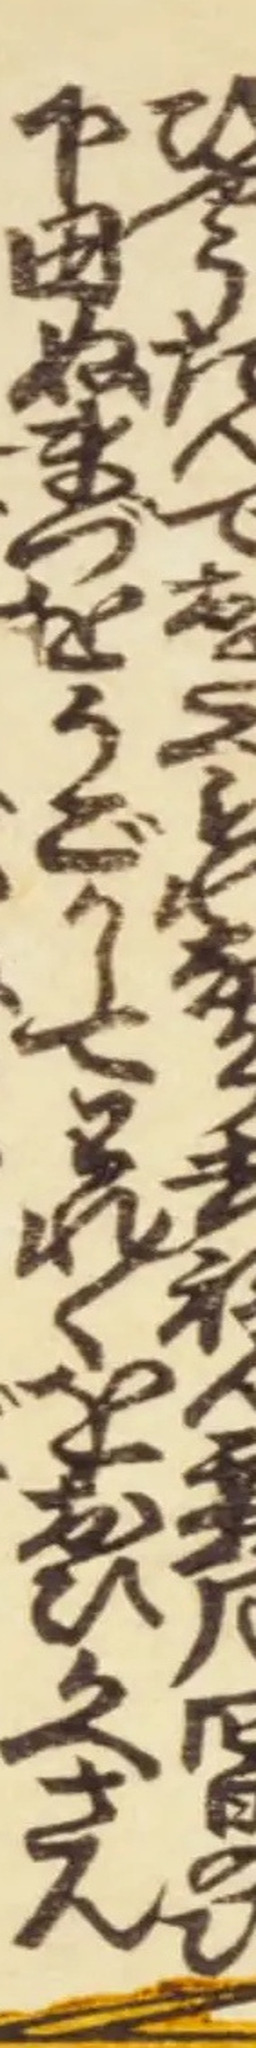御田ぬまづをうごかしてわれ〳〵をおひかへさん
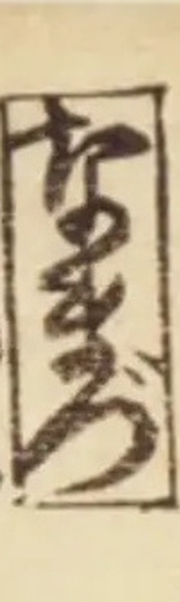なまづ
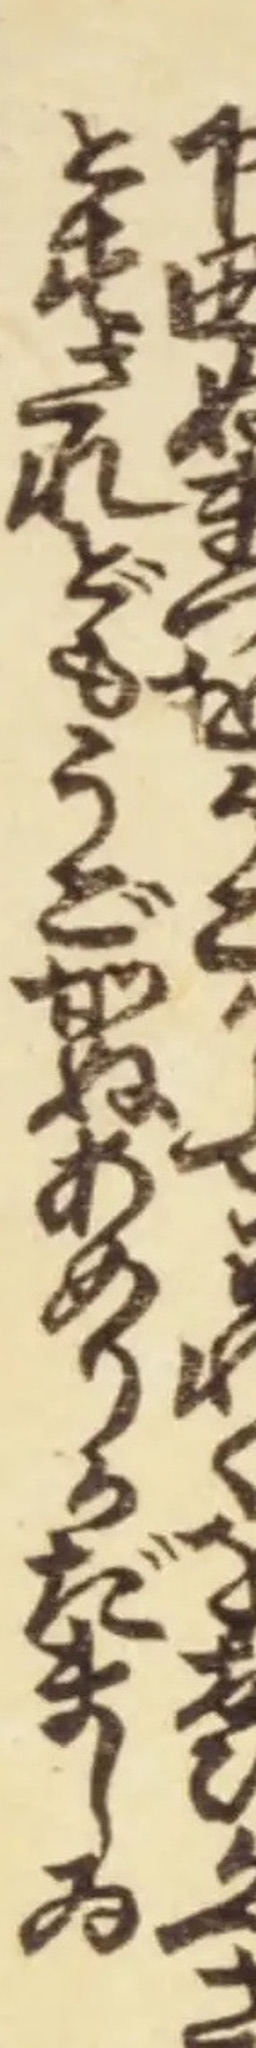とすされどもうごかぬあめりかだましゐ
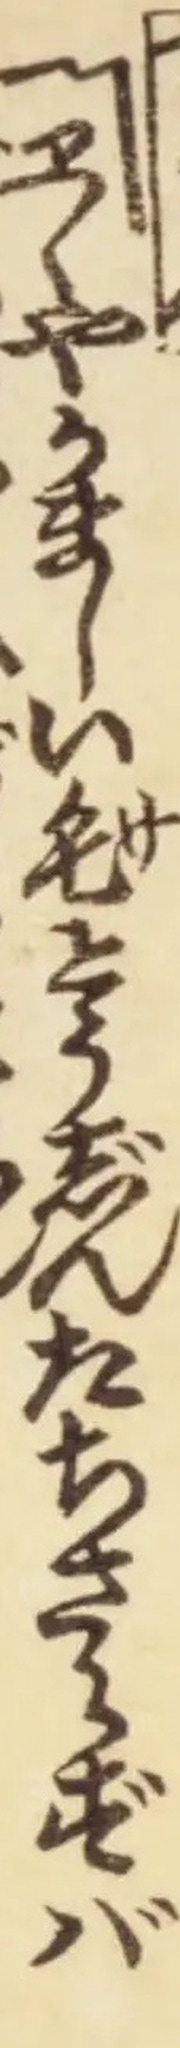〽ヱ〳〵やかましい毛とうじんたちさらずバ
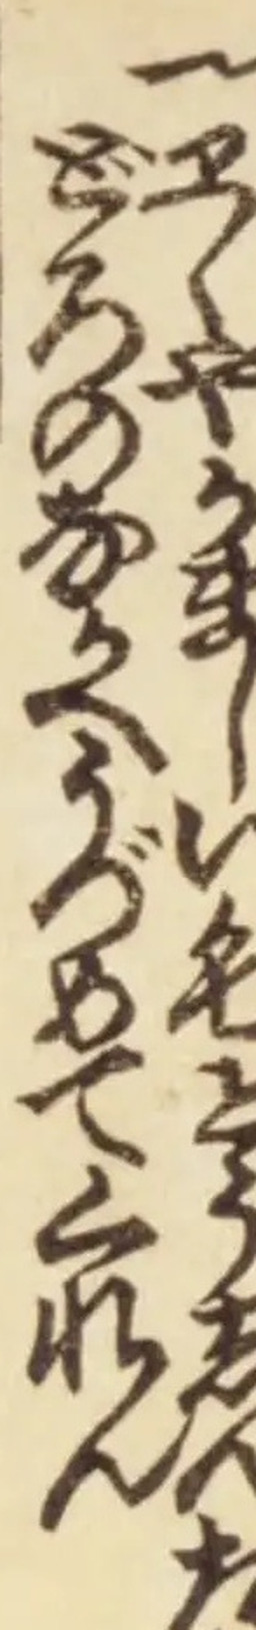どろのなかへうづめてくれん
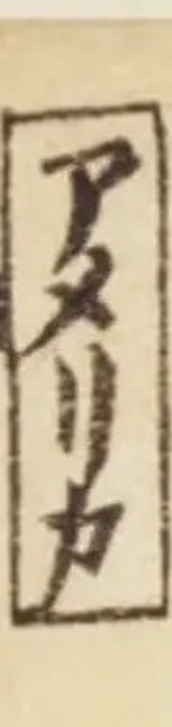アメリカ
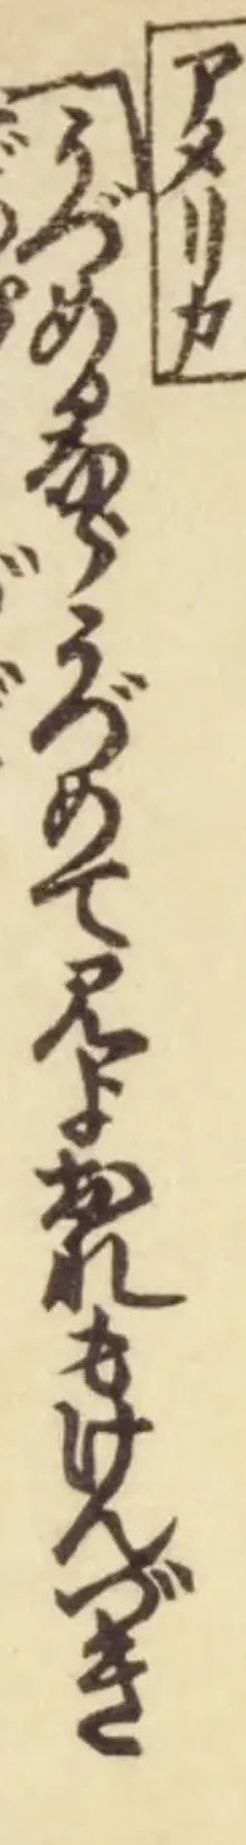〽うづめるならうづめてみよおれもけんづき
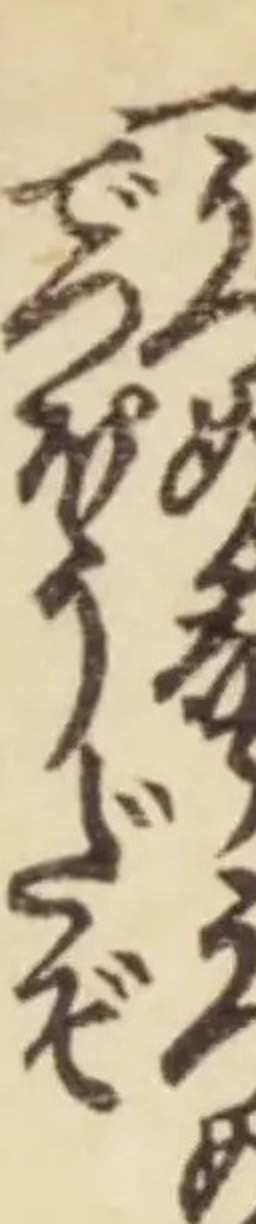でつぽうだぞ
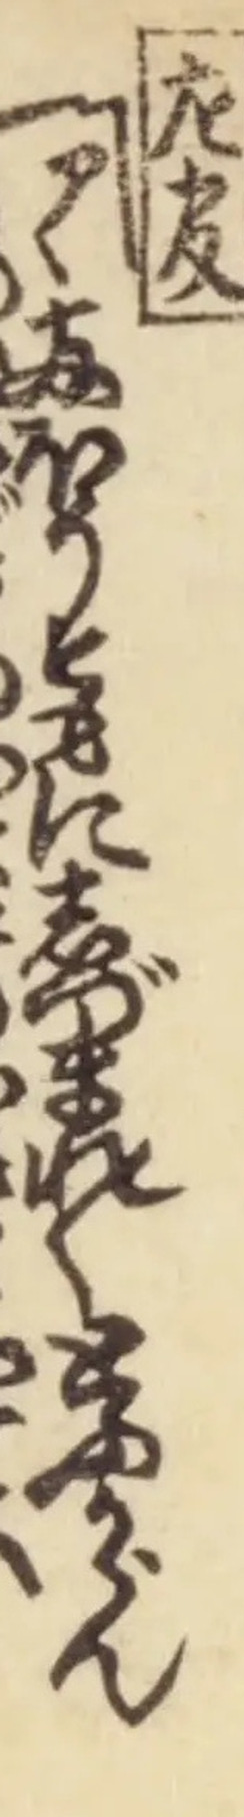〽アヽ両ほうともにしづまれ〳〵とふからん
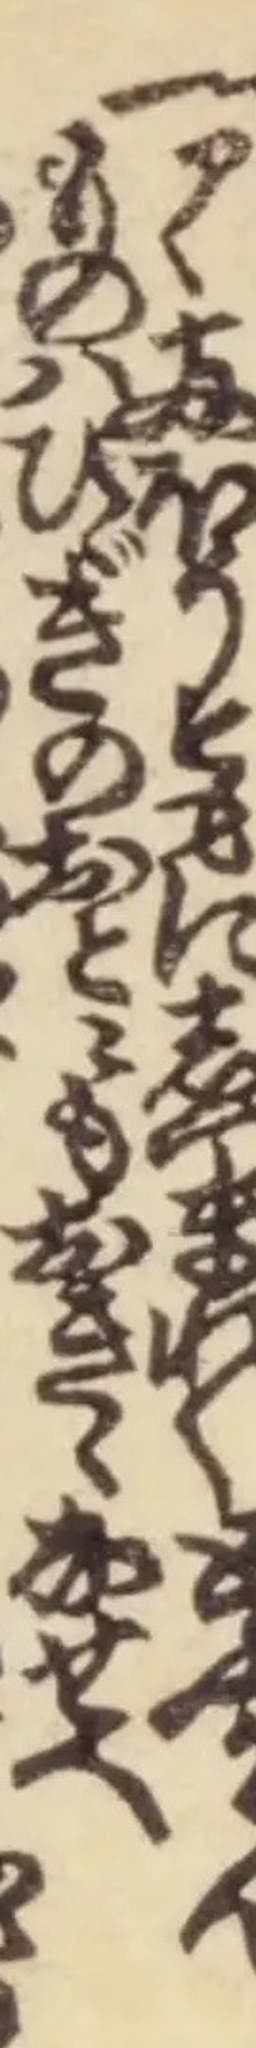ものハひゞきのおと〻もおきゝなせへ
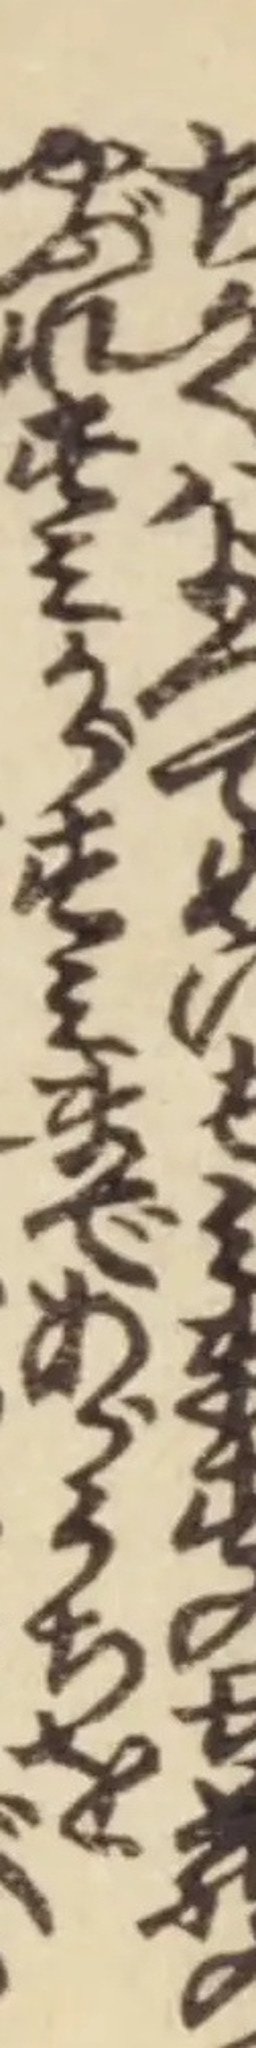やぶれすみからすみまであらうちを
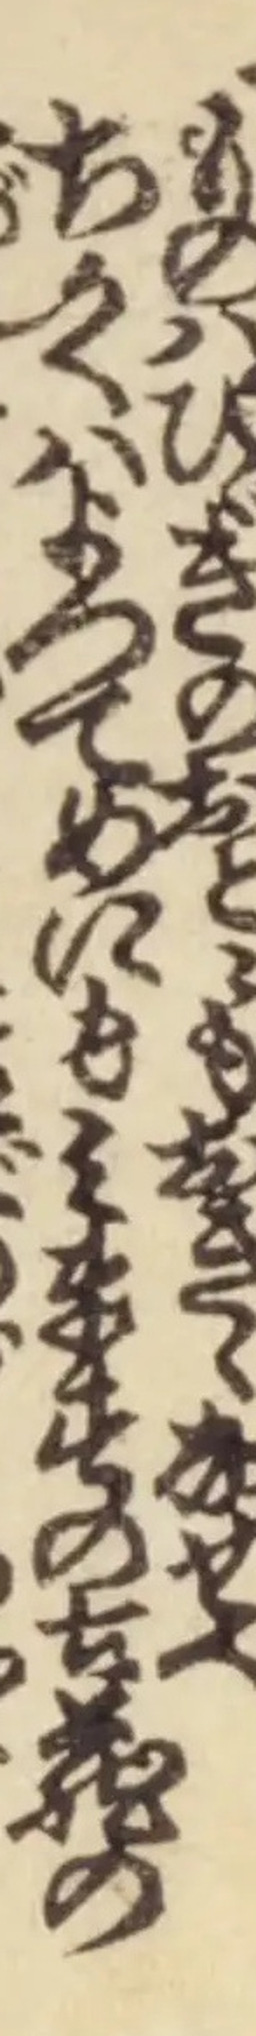ちかくハよつてめにもみますの古蔵の
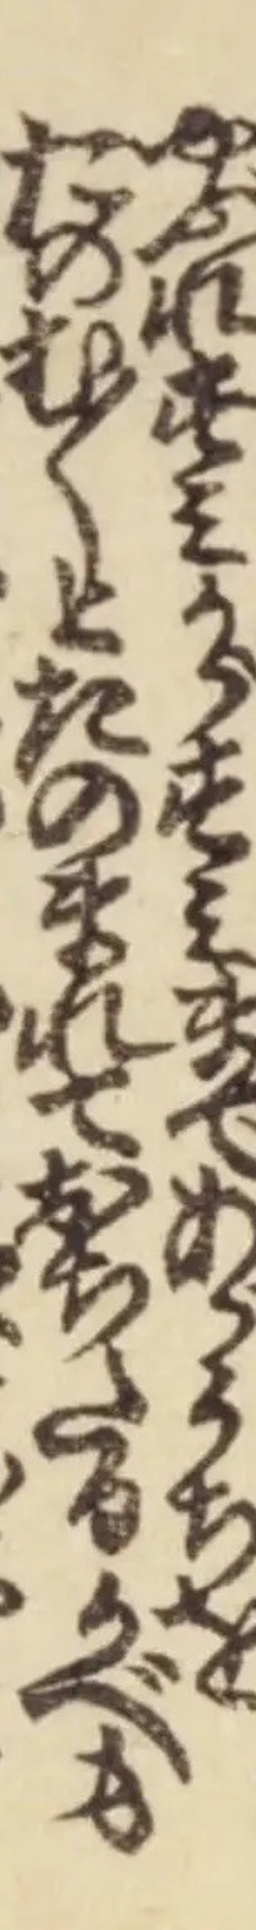たのむ〳〵とたのまれておちたるかべも
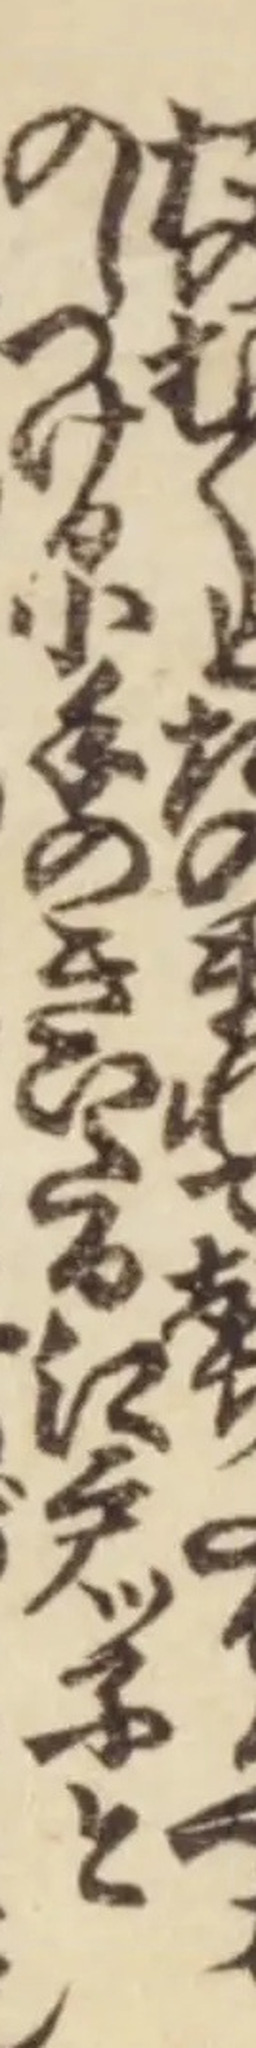のしつける小手のきいたる江戸ッ子と
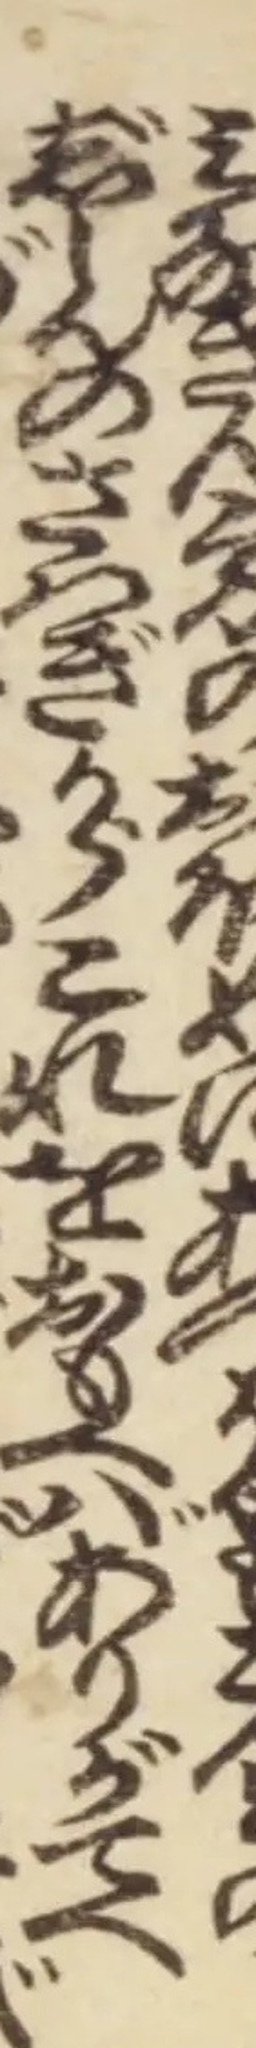じしんのさはぎからこれをおもへバありがてへ
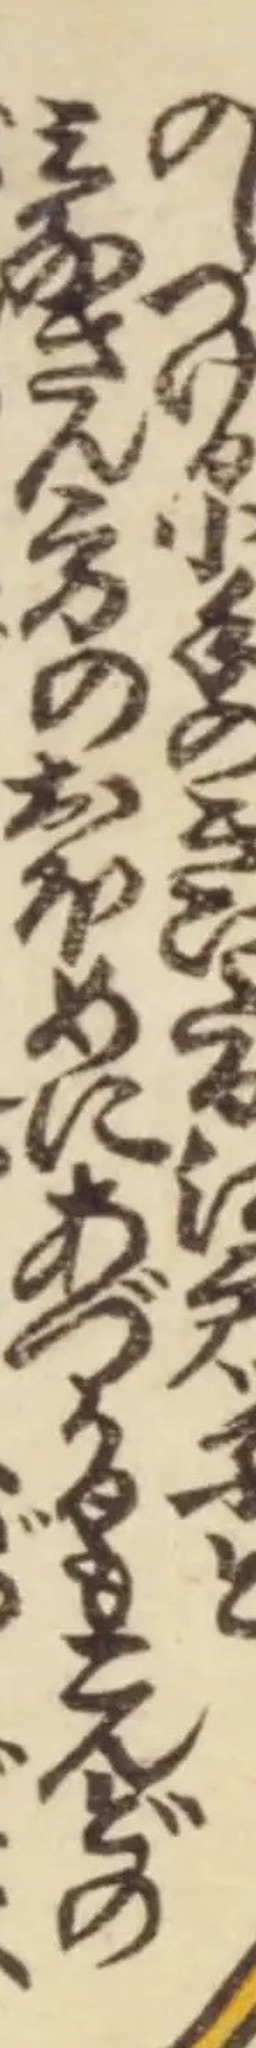みなさん方のおほめにあづかるもこんどの
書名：安政二年十月二日夜大地震鯰問答
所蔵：国立国会図書館 National Diet Library, JAPAN
